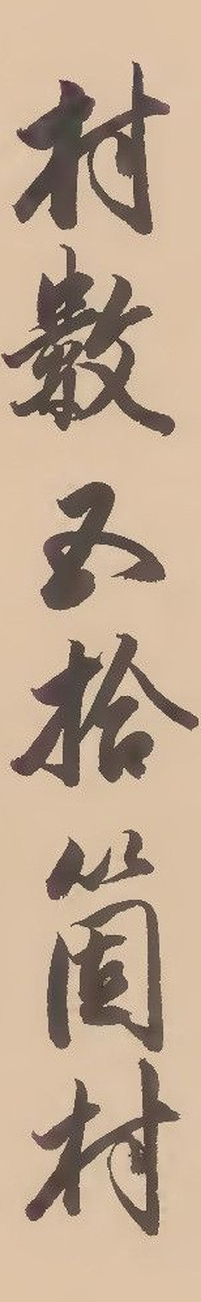村数五拾箇村

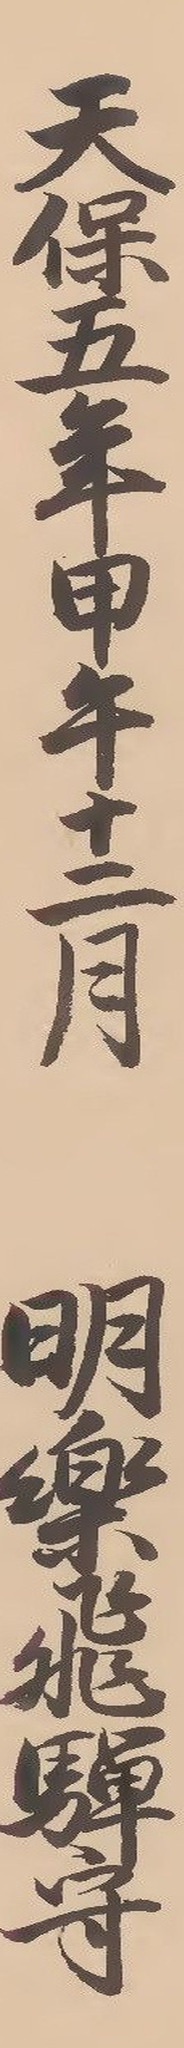天保五年甲午十二月明楽飛騨守
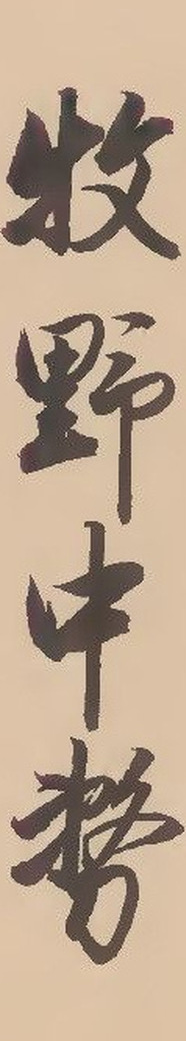牧野中務
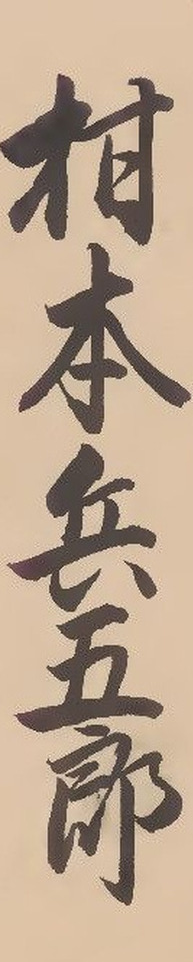柑本兵五郎
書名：壱岐国郷帳
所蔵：国立公文書館 National Archives of Japan
